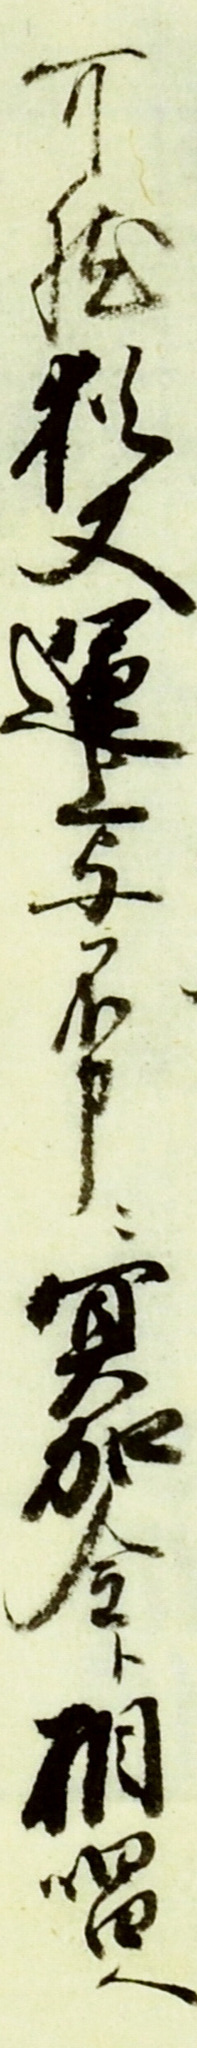可然猶又運上与不申ニ冥加金ト相唱へ
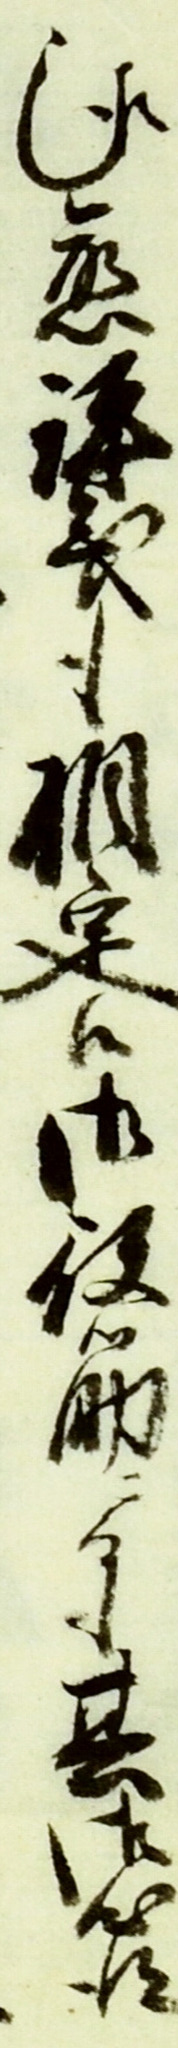趣愈評義も相定候御役筋ニ而も其御心得
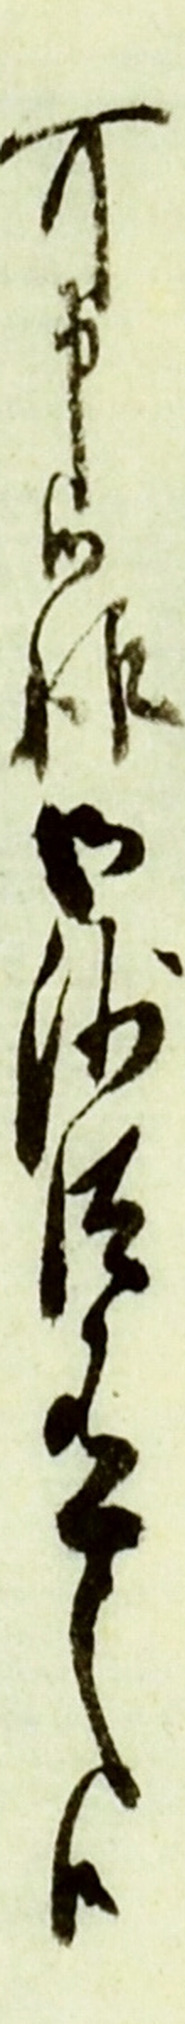可申候様御沙汰有之候
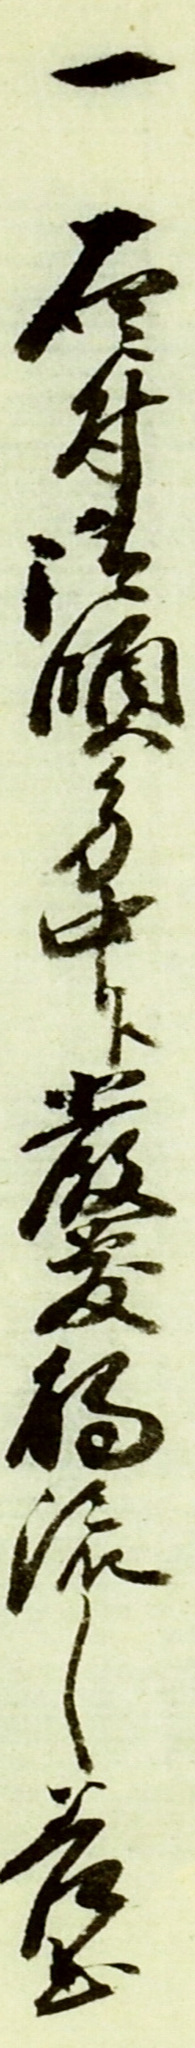一右ニ付御領分中ト厳敷触流し差出
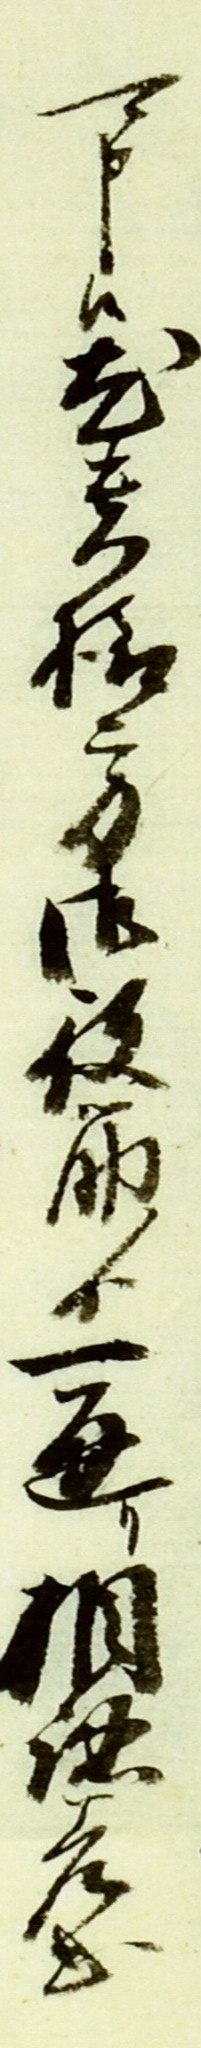可申候尤者様方御役筋ゟ一通り相認差出
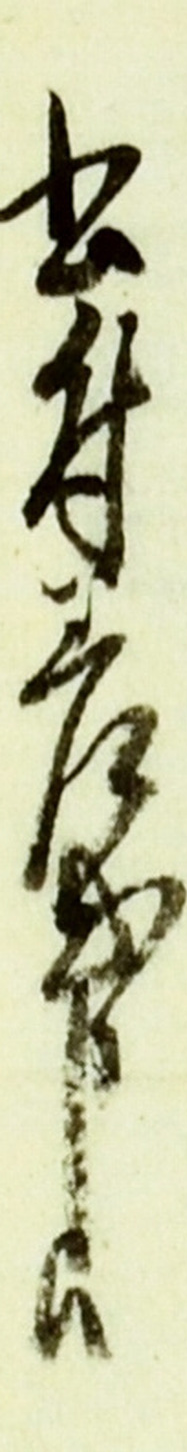書付差出申候
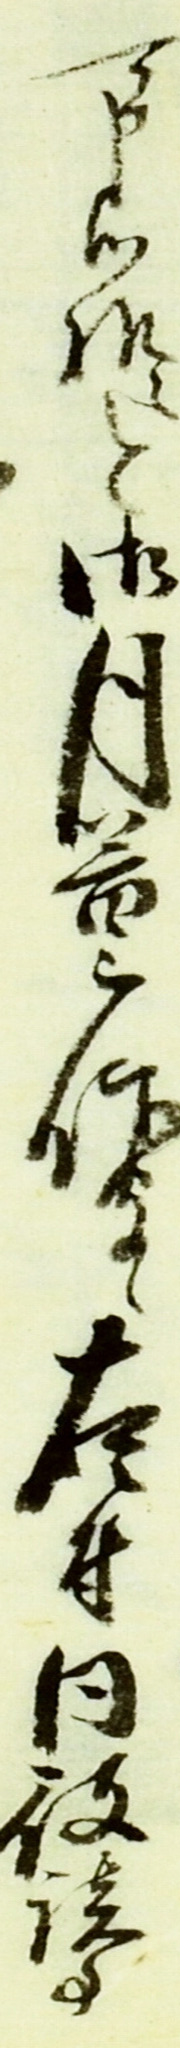可申候様ニと御月番被仰聞候右ニ付同役談事
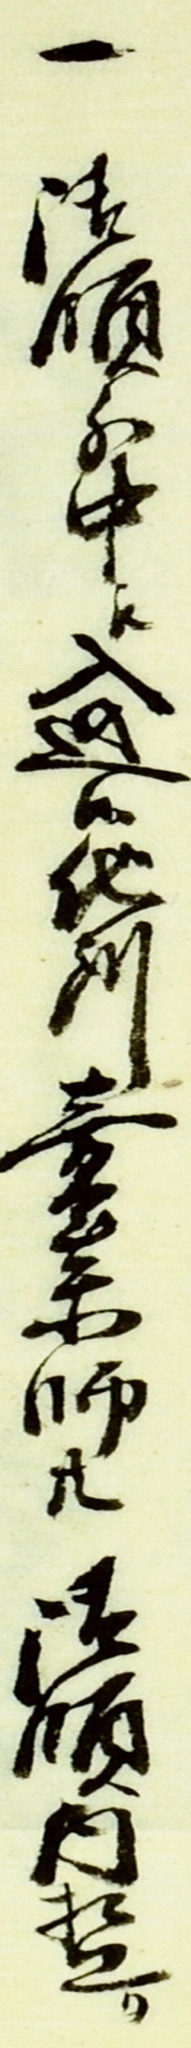一領分中江入込候他所売薬共御領内相廻り
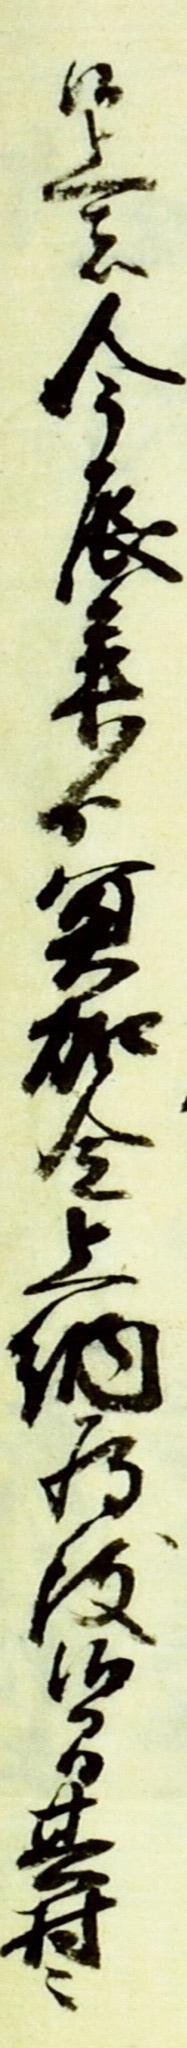候上者今辰年ゟ冥加金上納為致候間其村々
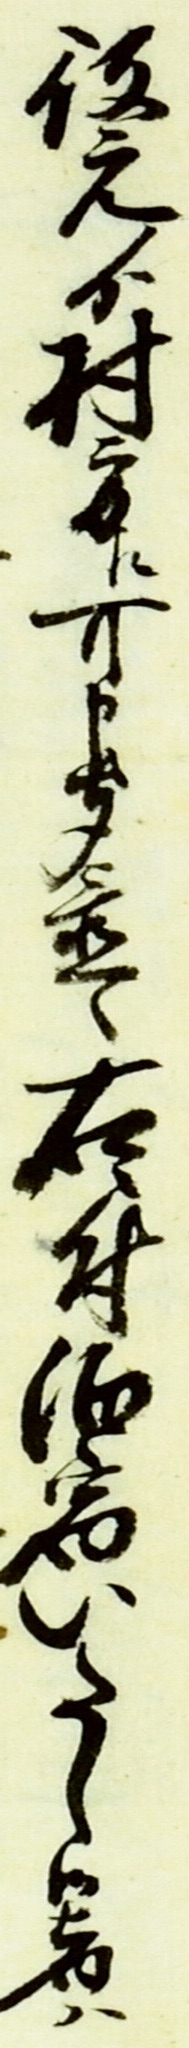役元ゟ村方江可申聞置候右ニ付泊宿いたし候者ハ
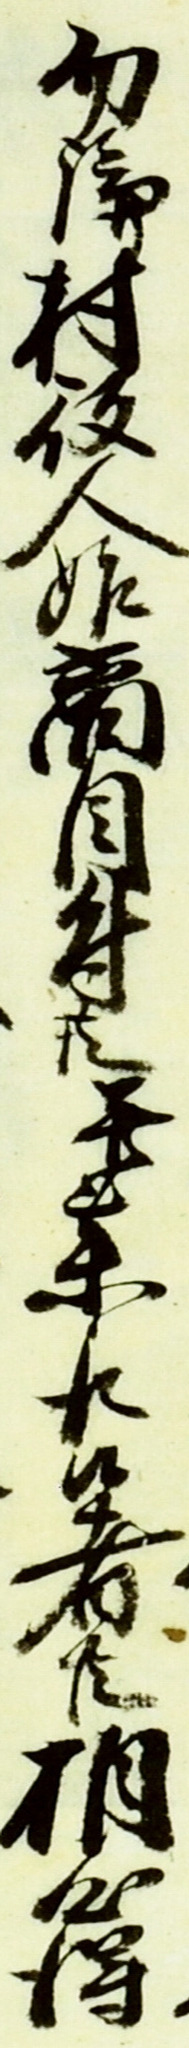勿論村役人始商目付共并薬取候者共相心得
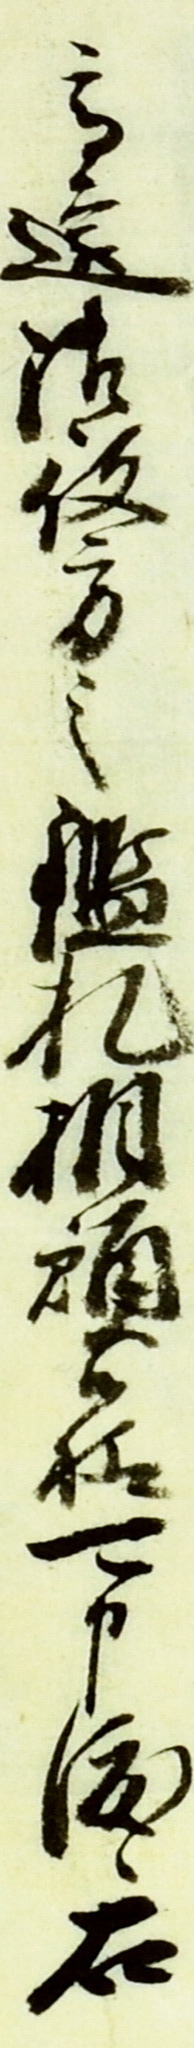高遠御役方之鑑札相願候様可申渡候右
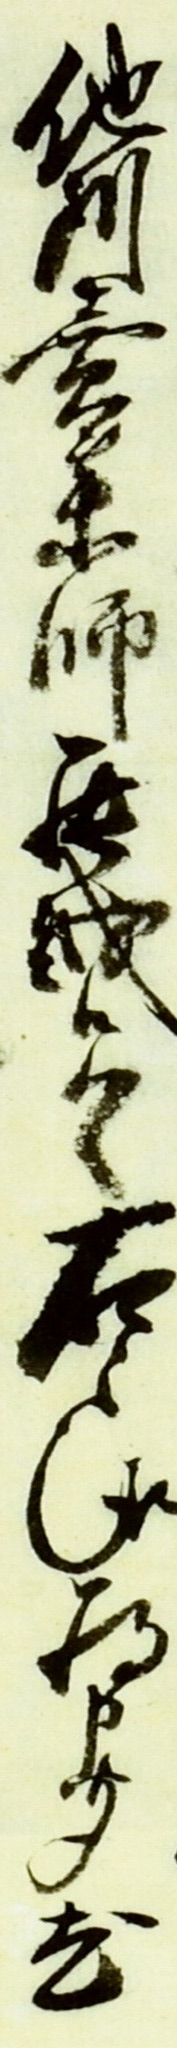他所売薬師罷越候ハヽ右之趣為申聞尤
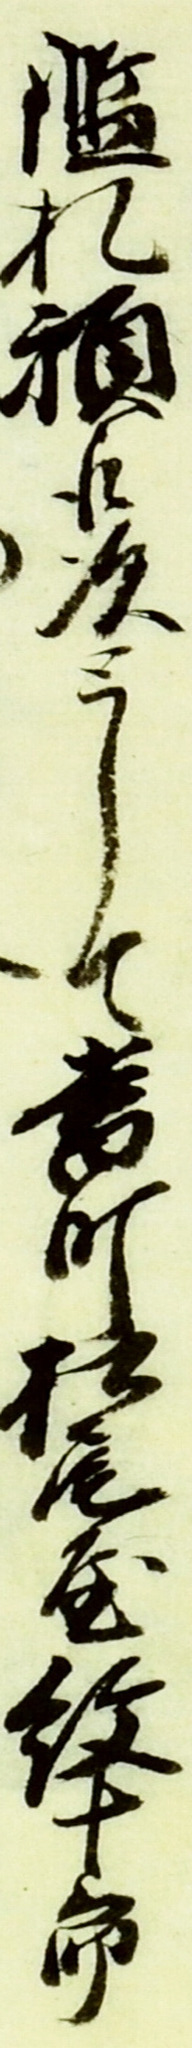鑑札願取次として当町松尾屋紋十郎
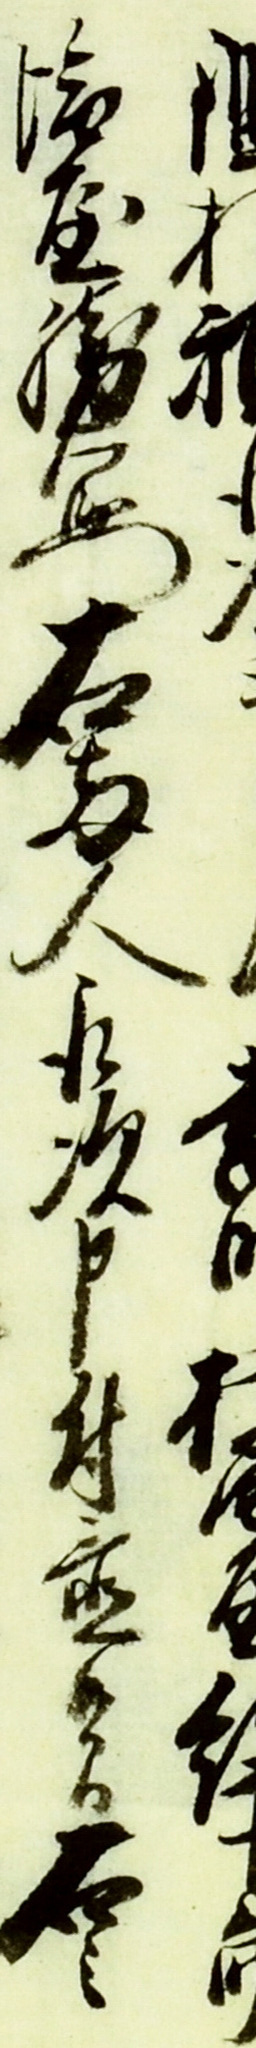塩屋勝右衛門右両人取次申付置候間右之
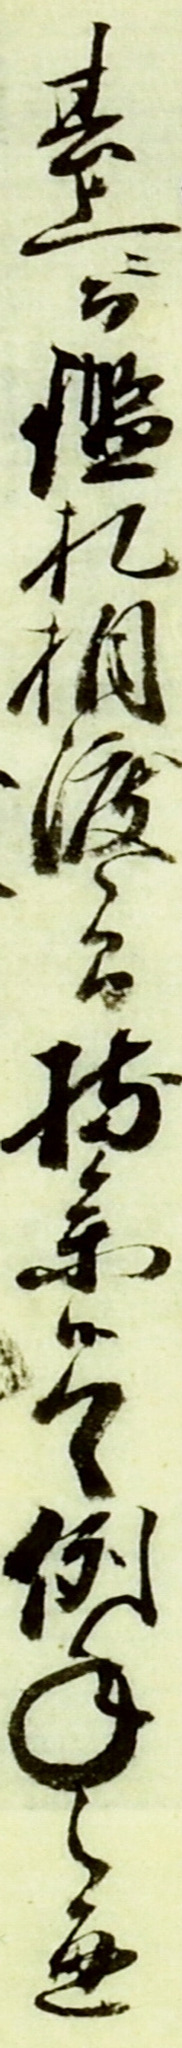其上ニ而鑑札相渡候間持参候ハヽ例年之通
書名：他国賣薬師運上之事
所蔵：伊那市立高遠町図書館・合同会社AMANE
